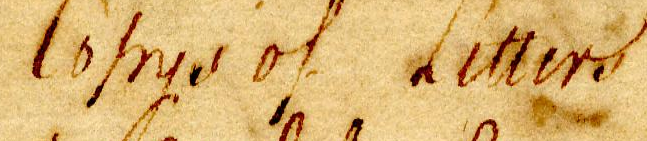Copys of Letters
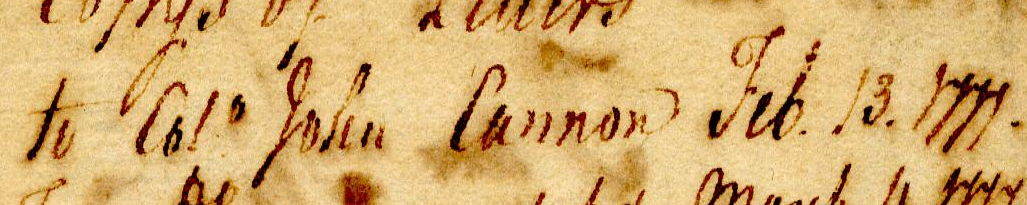to Col^o. John Cannon Feb. 13. 1777.
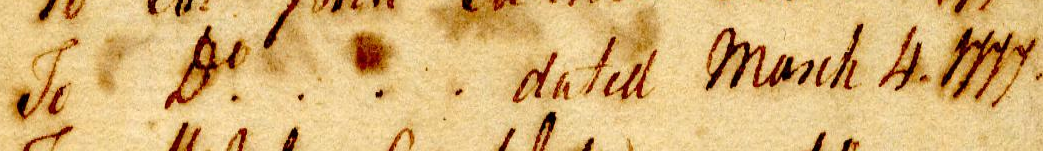To D^o... dated March 4. 1777.
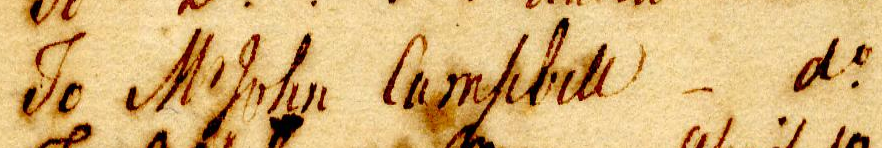To M^r John Campbell- d^o
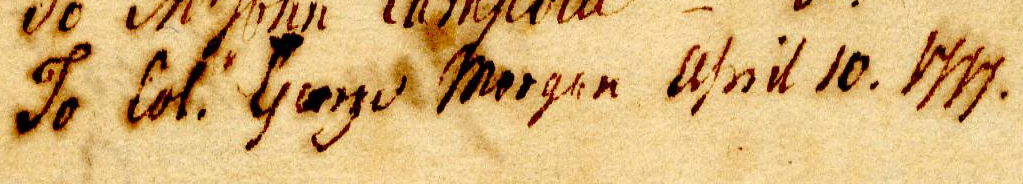To Col. George Morgan April 10. 1777.
